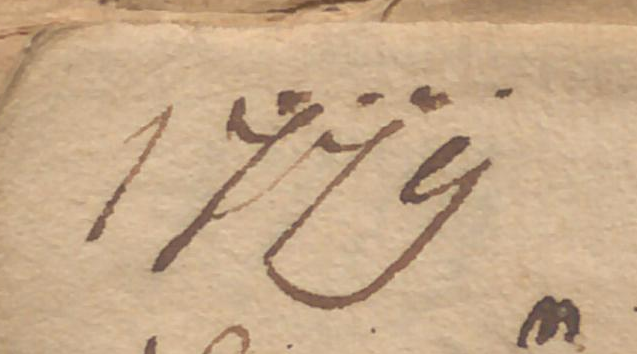1779
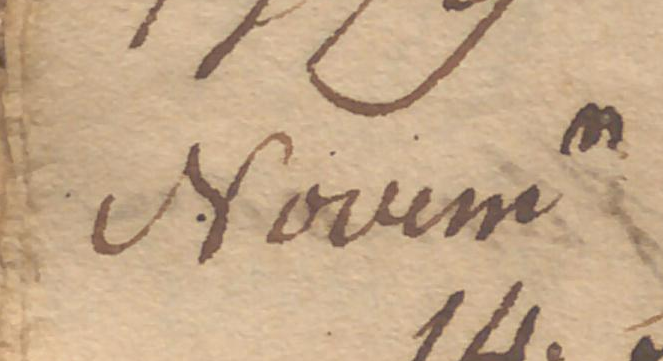Novem^r
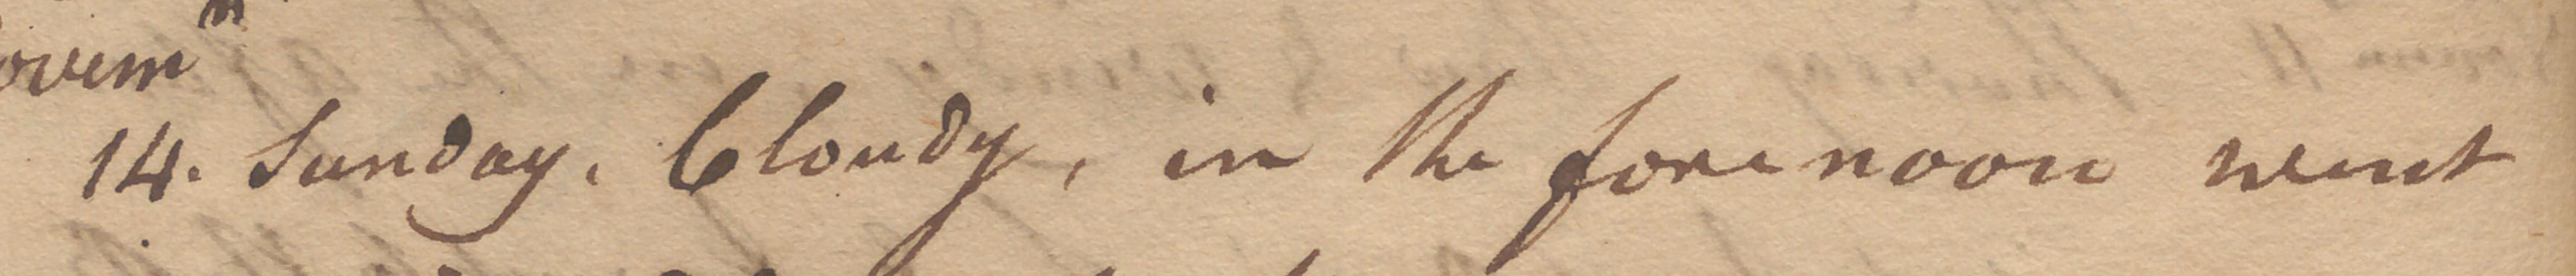14. Sunday. Cloudy, in the forenoon went
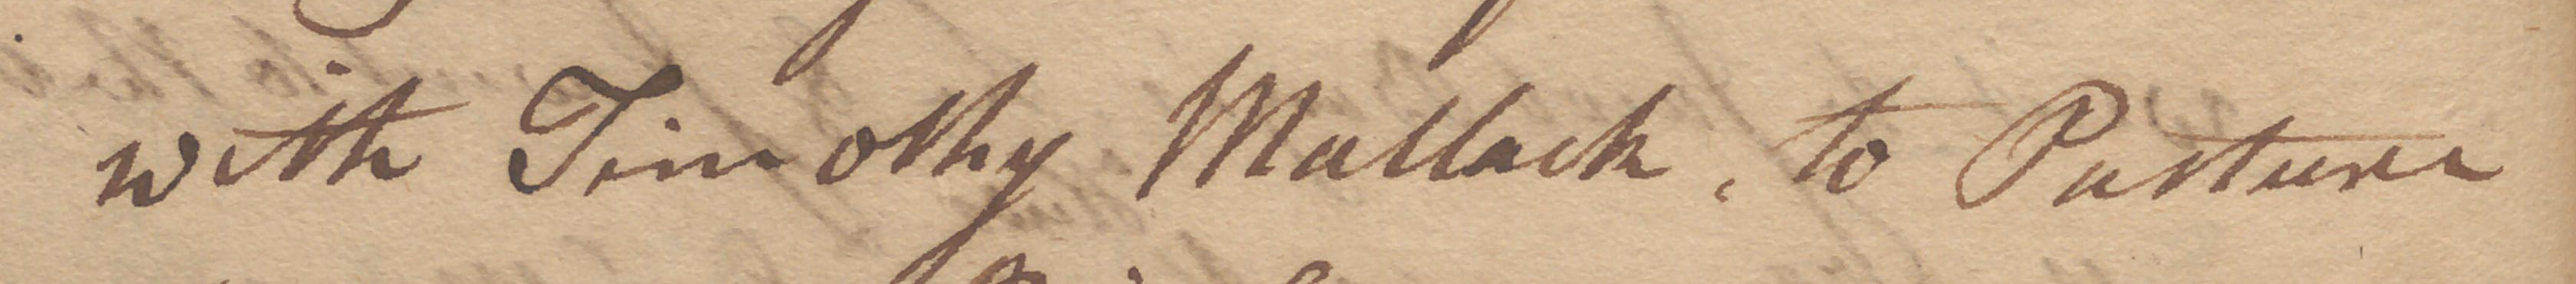with Timothy Matlack to Pasture
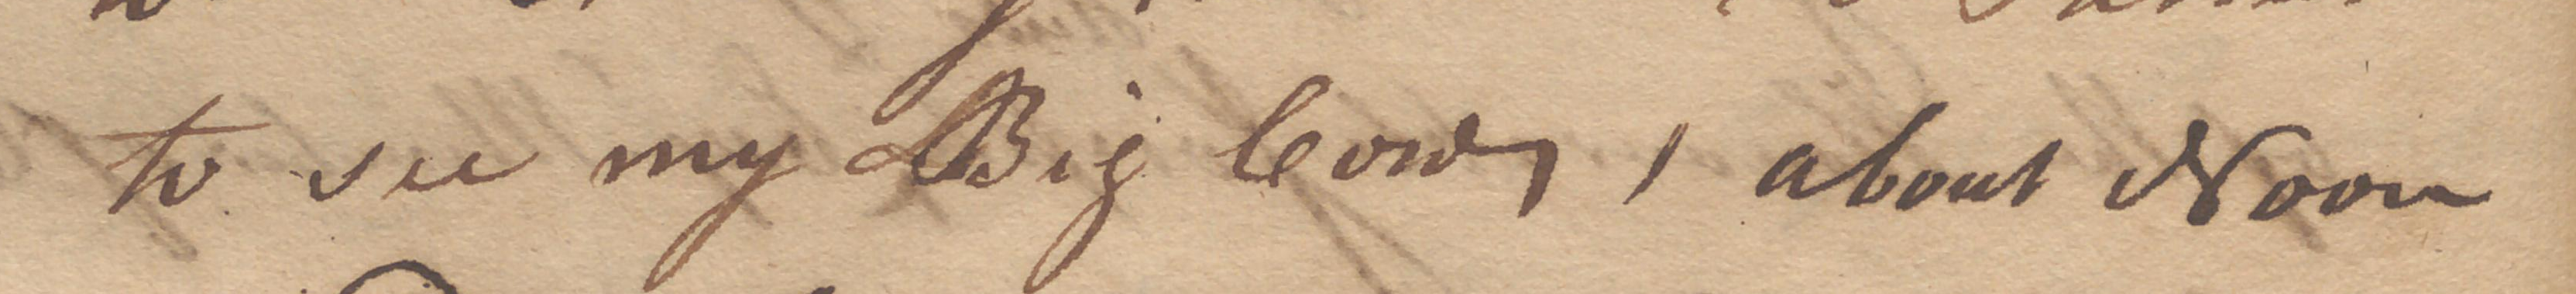to see my Big Cow / about Noon
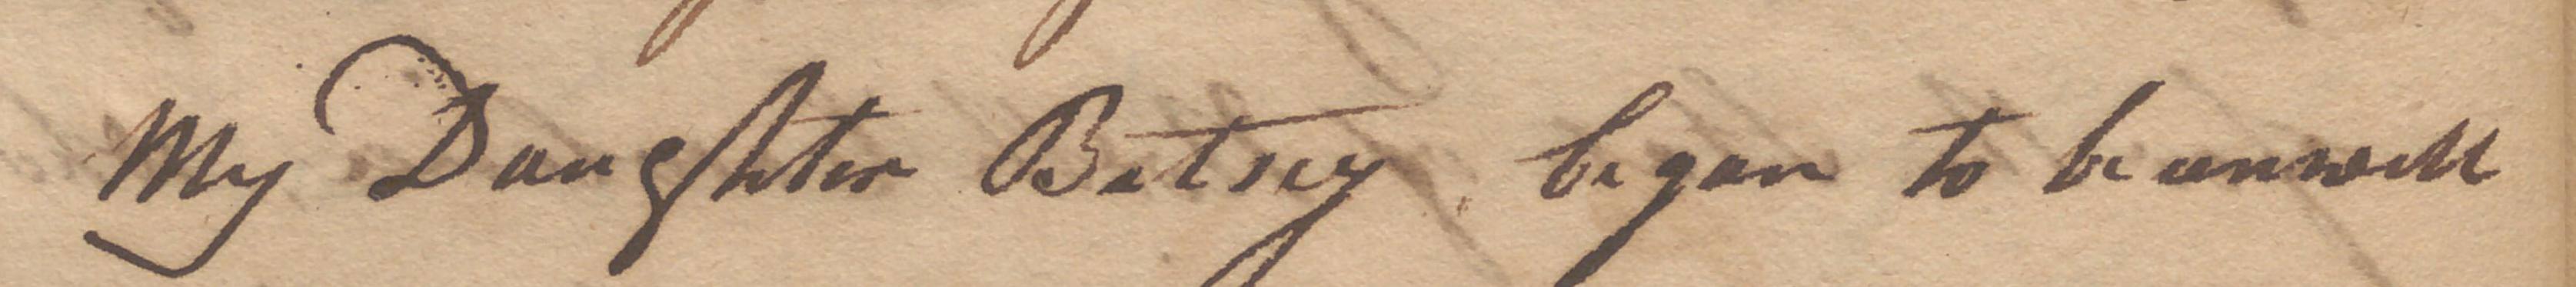My Daughter Betsey began to be unwell
